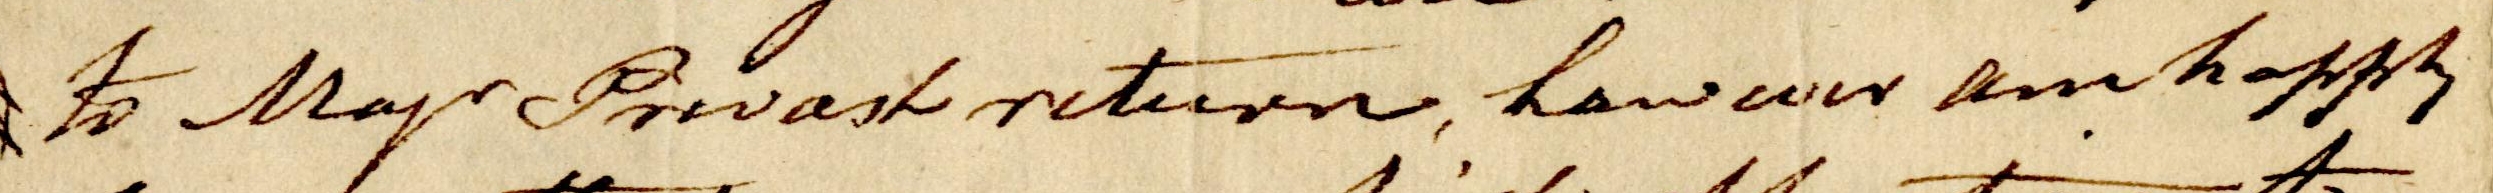to Maj^r Provost return, however am happy
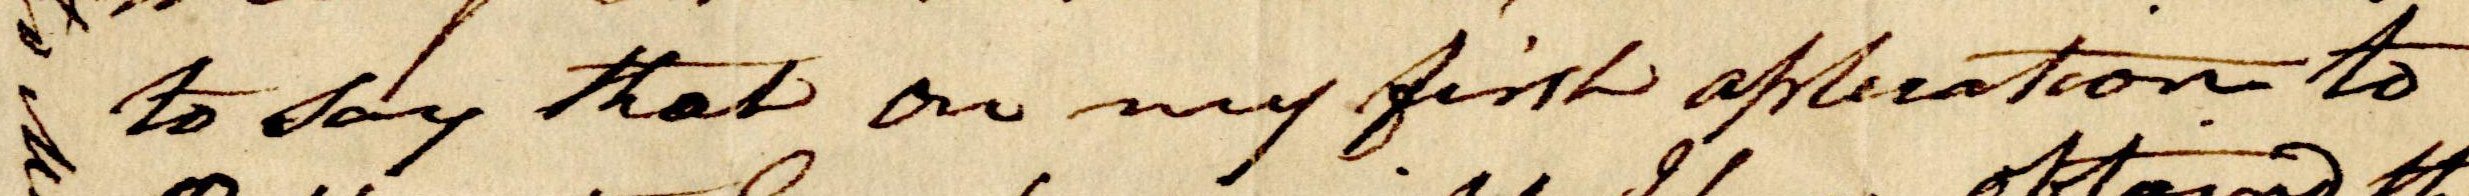to say that on my first aplication to
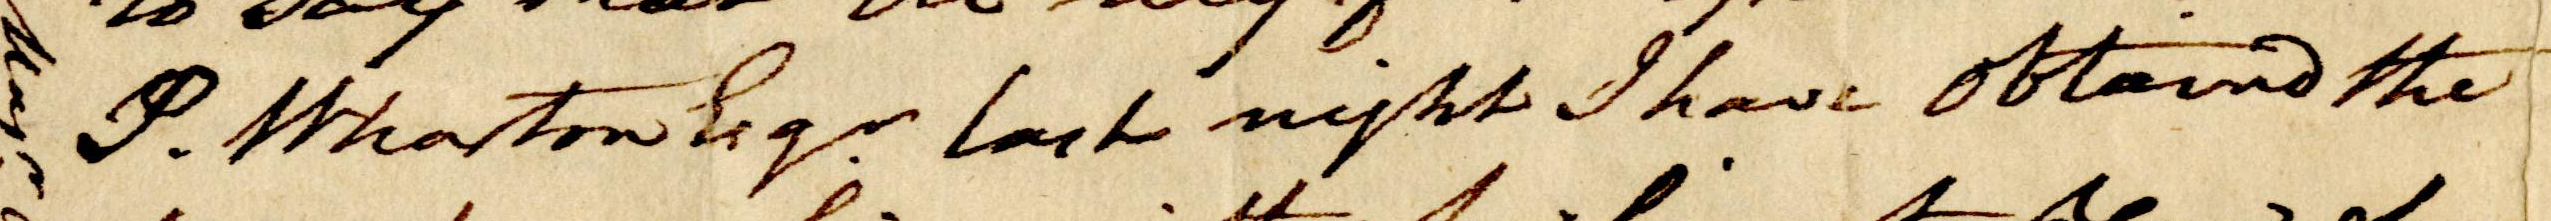P. Wharton Esq^r last night I have obtaind the
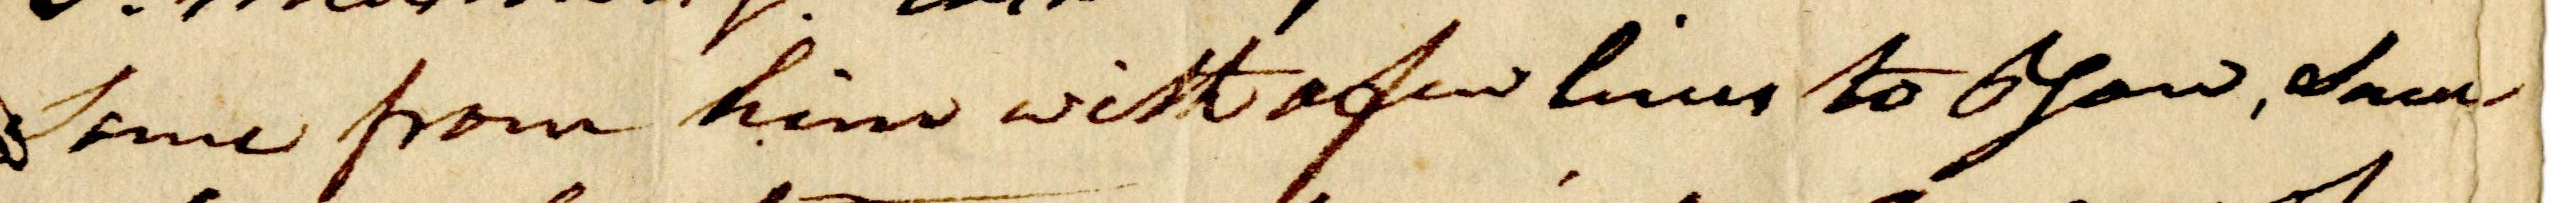same from him with a few lines to you, Save
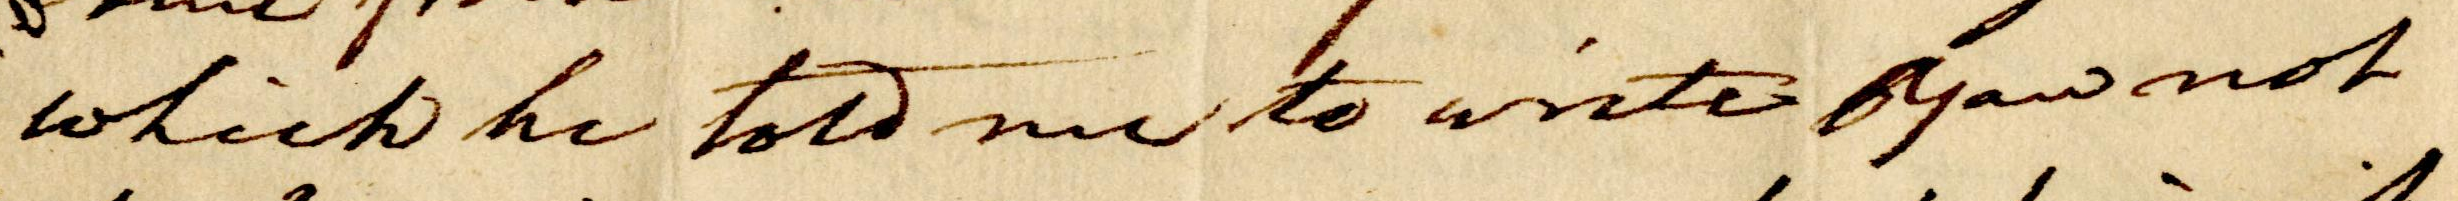which he told me to write you not
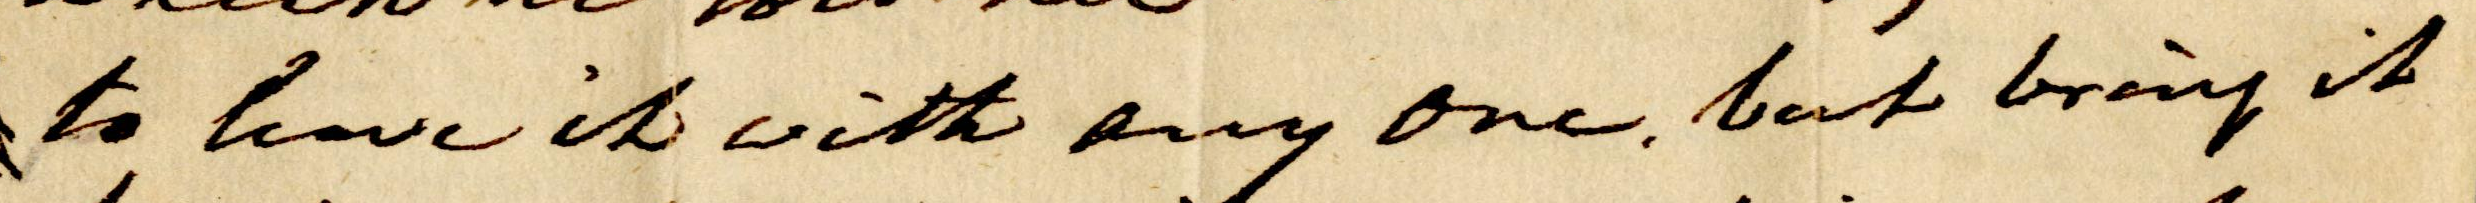to leave it with any one, but bring it
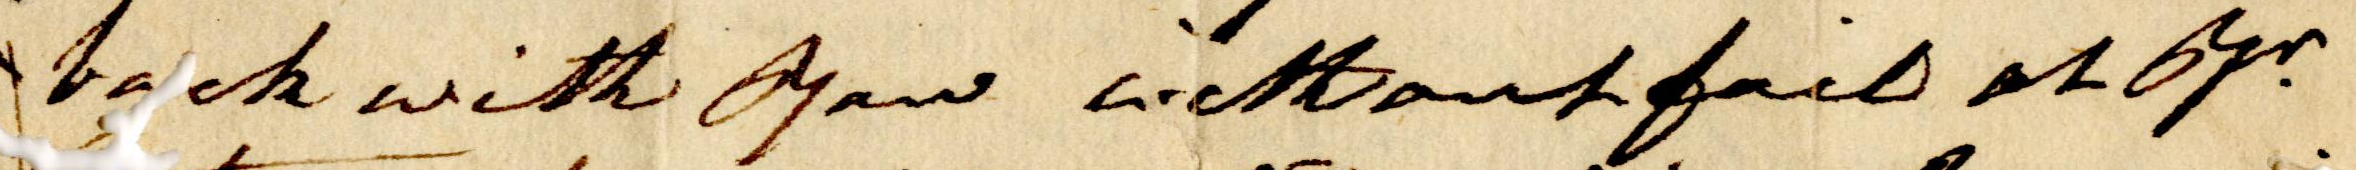back with you without fail at y^r.
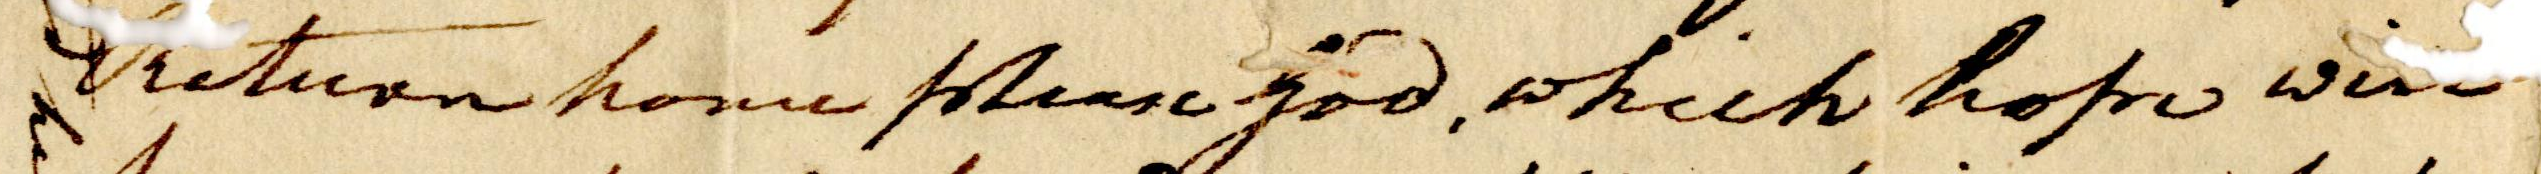return home please God, which hope will
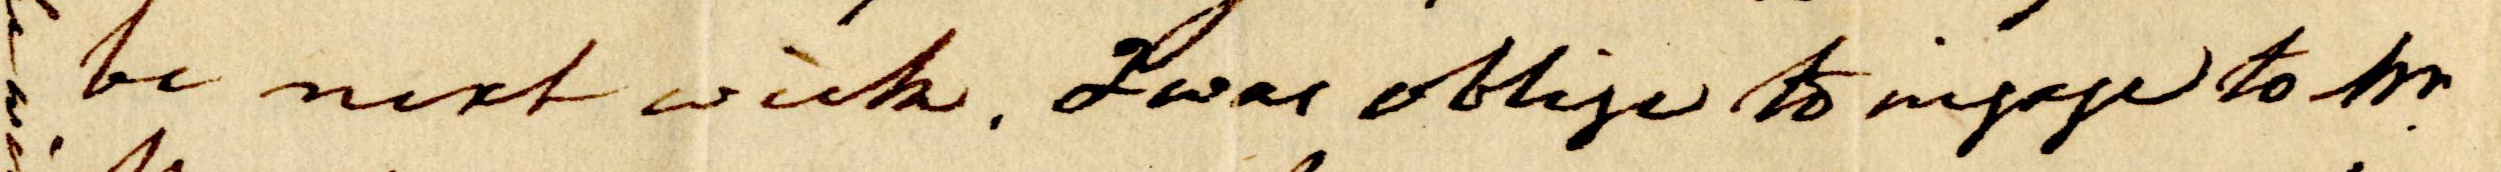be next week, I was oblige to message to m^r
